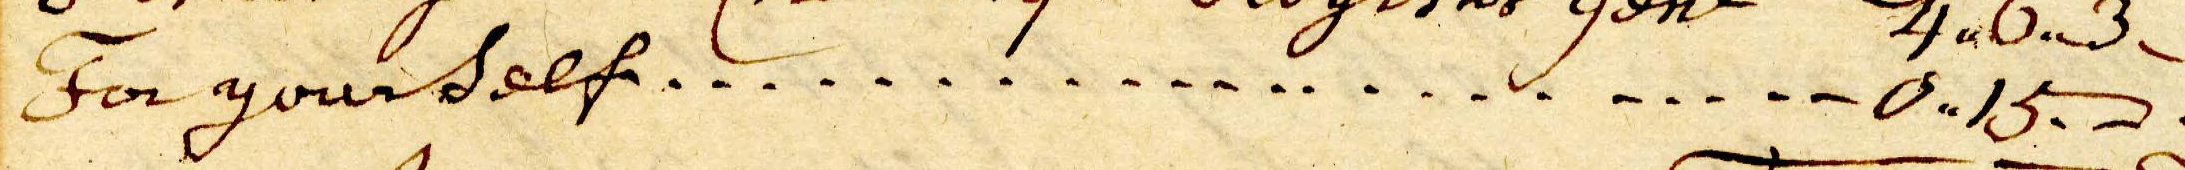For your Self...................... 0..15.-
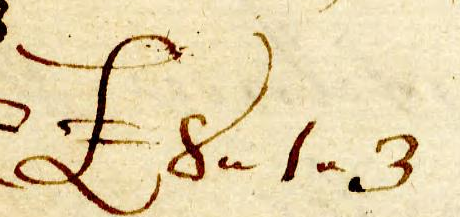£8..1..3
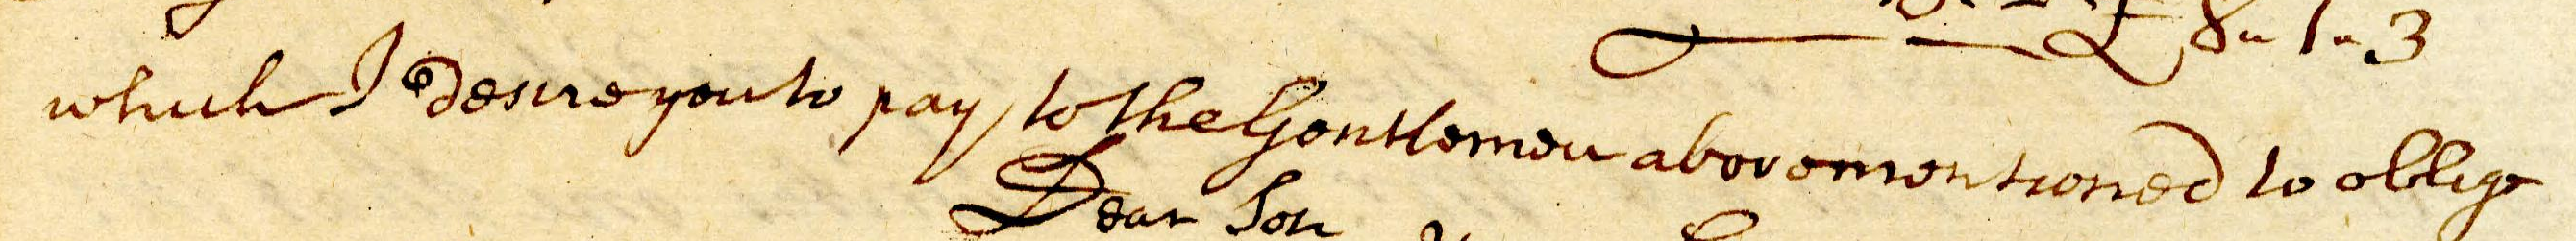which I desire you to pay to the Gentlemen abovementioned to oblige
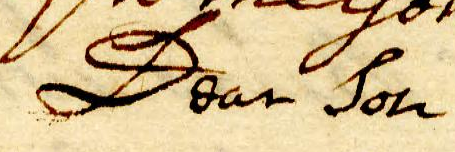Dear Son
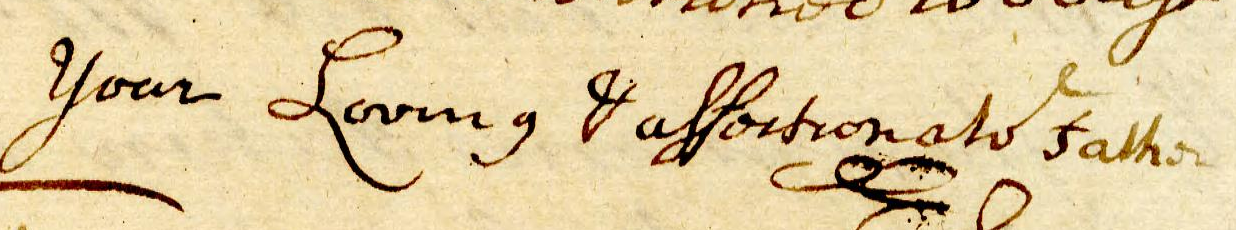Your Loving & affectionate^e Father
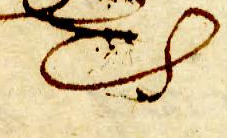ES
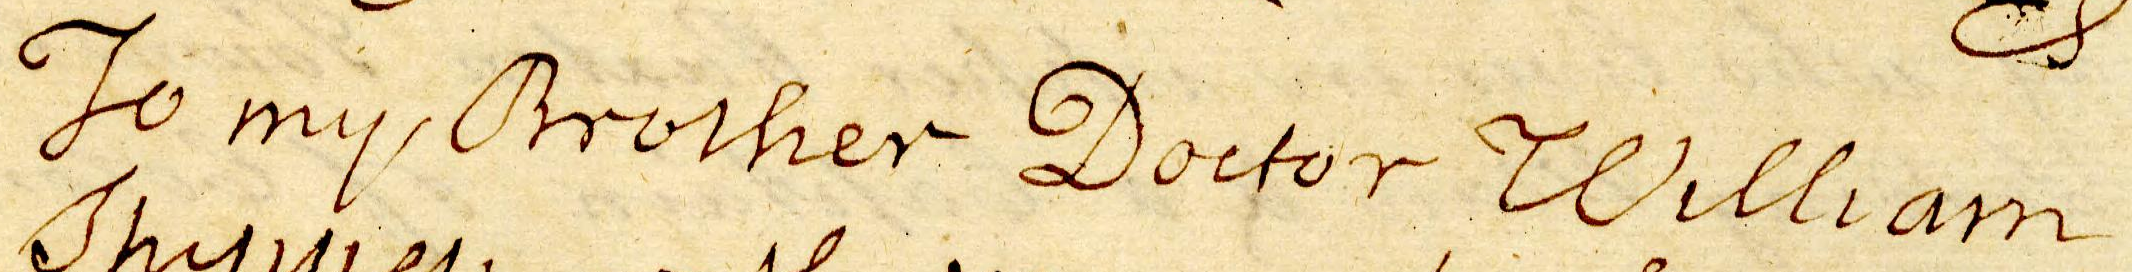To my Brother Doctor William
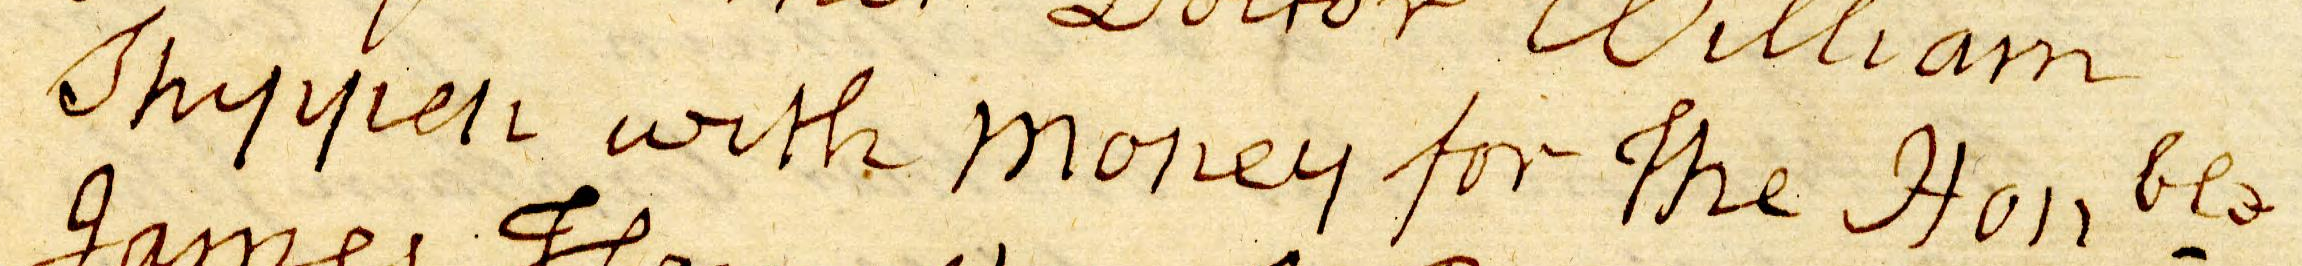Shippen with Money for the Hon^ble
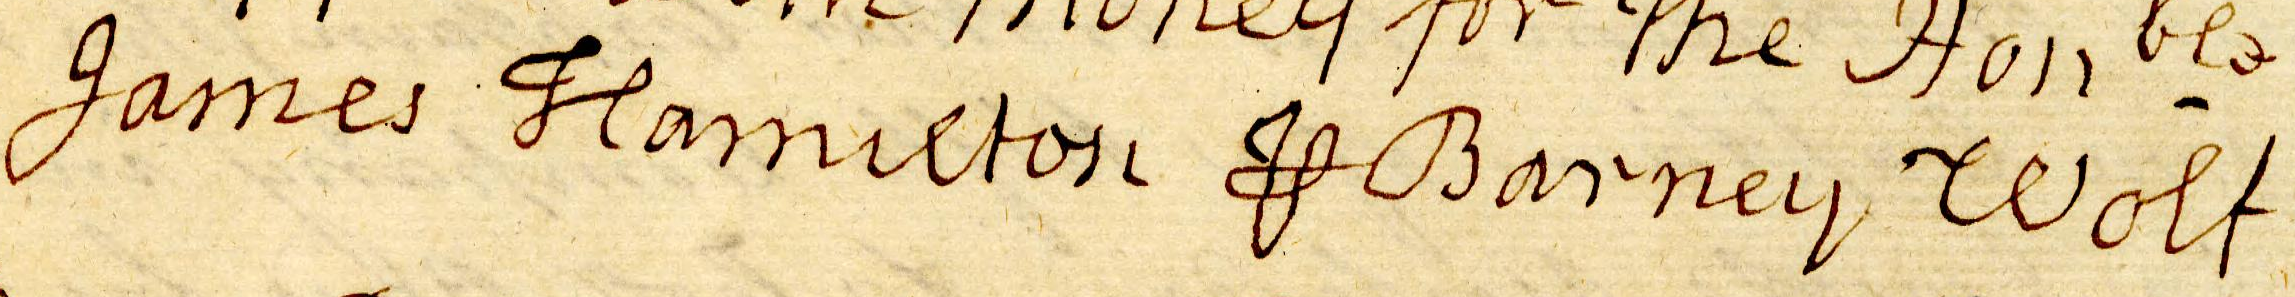James Hamilton per Barney Wolf
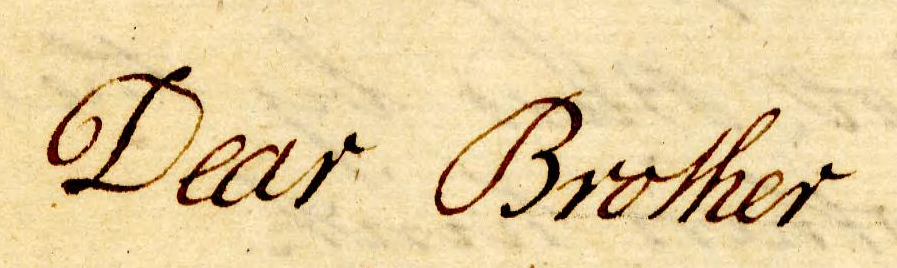Dear Brother
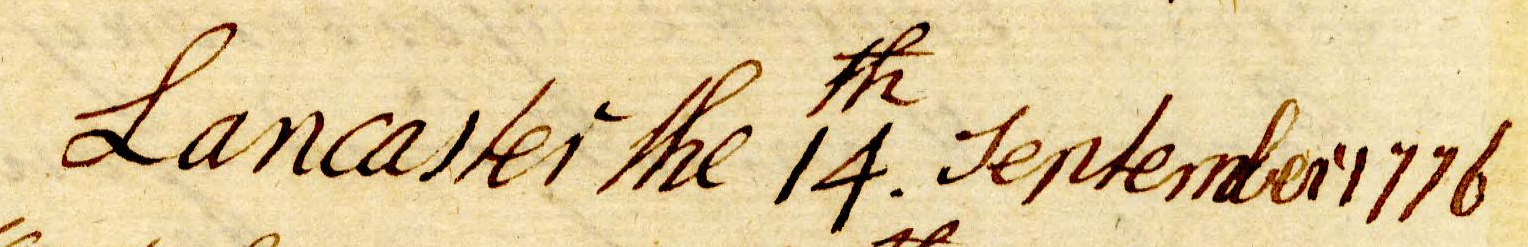Lancaster the 14^th. September 1776
